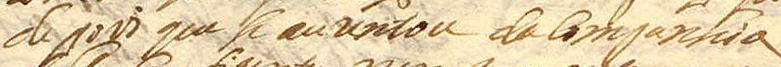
depois que se auzentou da Companhia
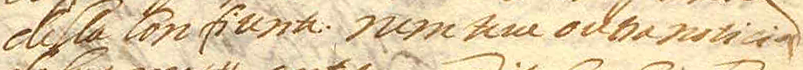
della confitente nem teue outra noticia
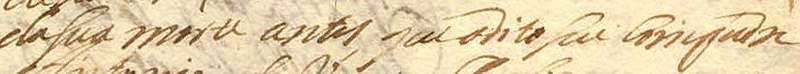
da sua morte antes, que o dito seu compadre
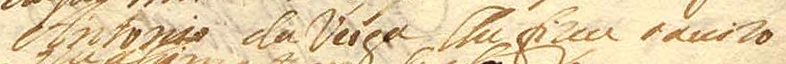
Antonio da Veiga lhe fizece o auizo
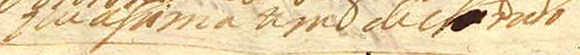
que asima tem declarado
